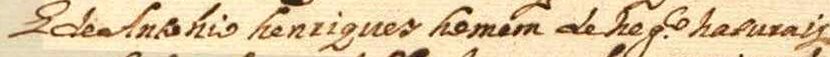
E de António henriques homem de neg.co naturais
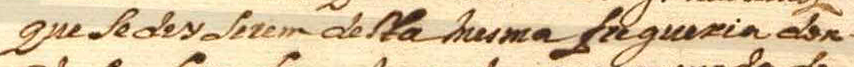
que se dis serem desta mesma freguezia don
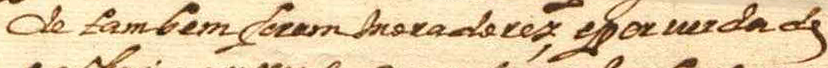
de tambem foram moradorez, e por uerdade
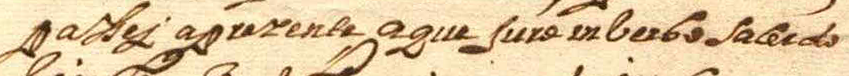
passej a prezente, a que juro in verbo sacerdo
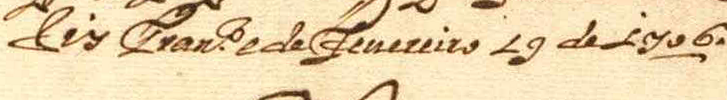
tis Tran.co e de Feuereiro 19 de i706.
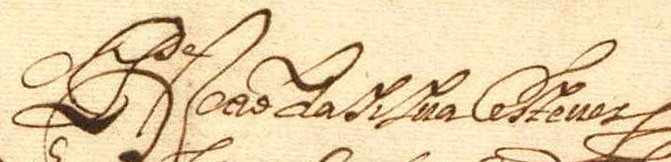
O Pe Joaõ da Silua Esteuez
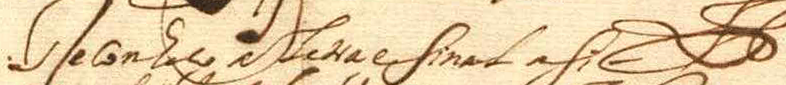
Reconheço a Letra, e sinal asi
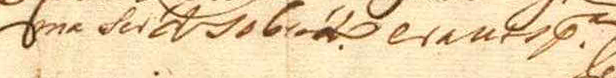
ma ser do sobred̄.o era ut sp̄.a
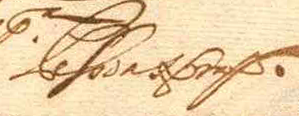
Pessoa Homē
